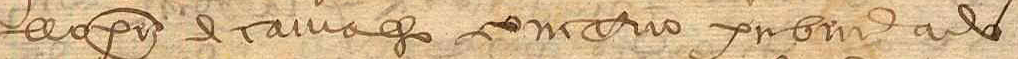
llopiz de carualho coneguo prebendado
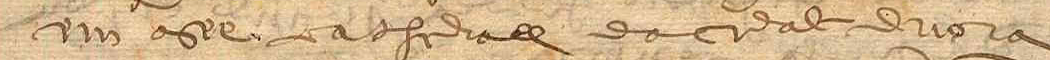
em a see cathedrall da cidade deuora
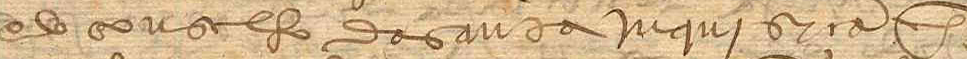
e do conselho da santa Jnqujsyçā c̄ꝭ
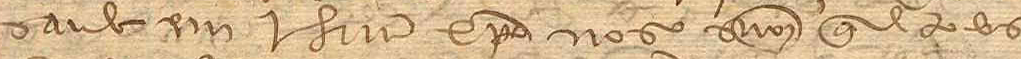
saude em Jhuū xp̄o noso sn̄or q̄ de todos
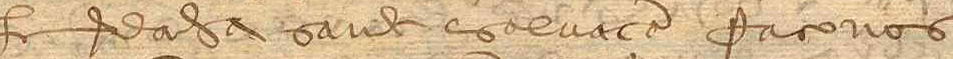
he ꝟdadja saude e saluaçā faco uos
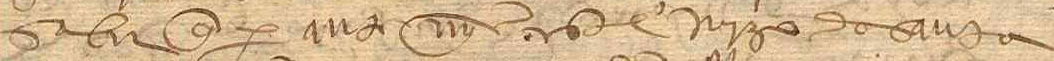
saber q̄ ꝑante m̄j ē este Jujzo da santa
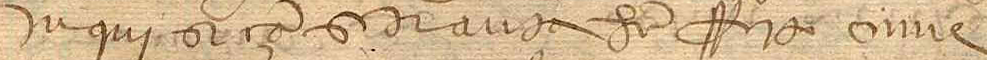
Jnqujsiçā se trauta hū ffejto crime
